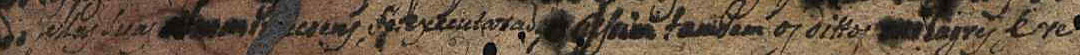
do, ellas suas alum___coens, se_ executaraõ _ assim tambem os dittos milagres, se re
